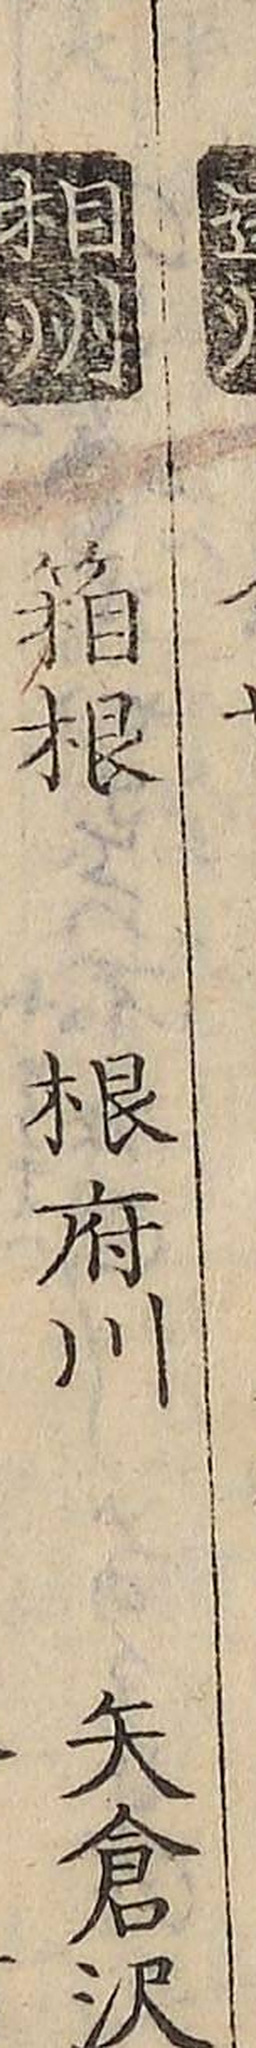相州箱根根府川矢倉沢
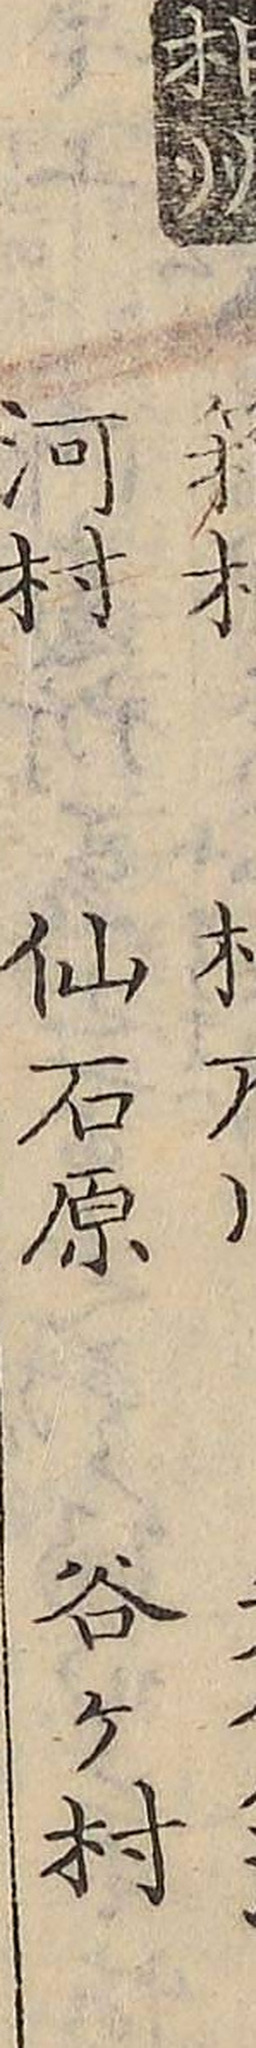河村仙石原谷ケ村
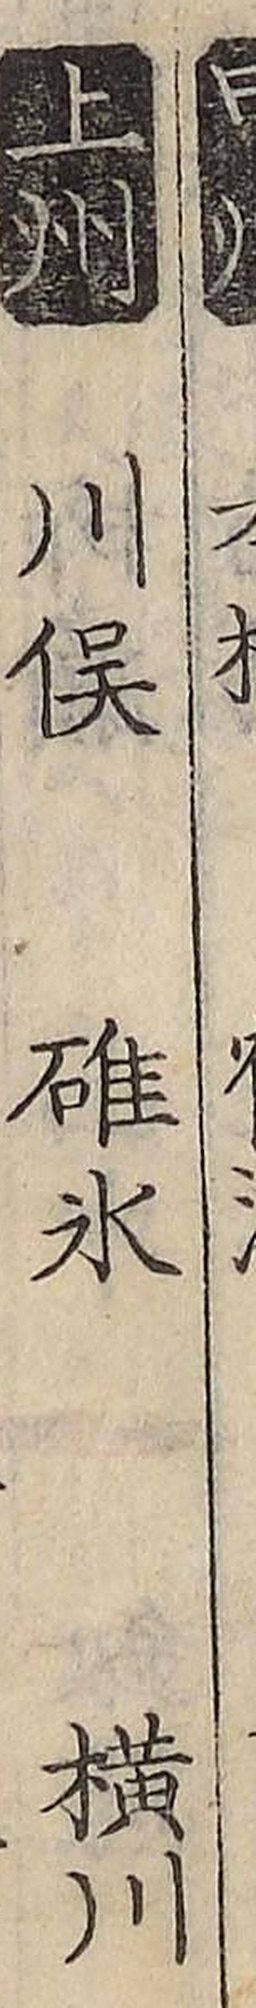上州川促碓氷横川

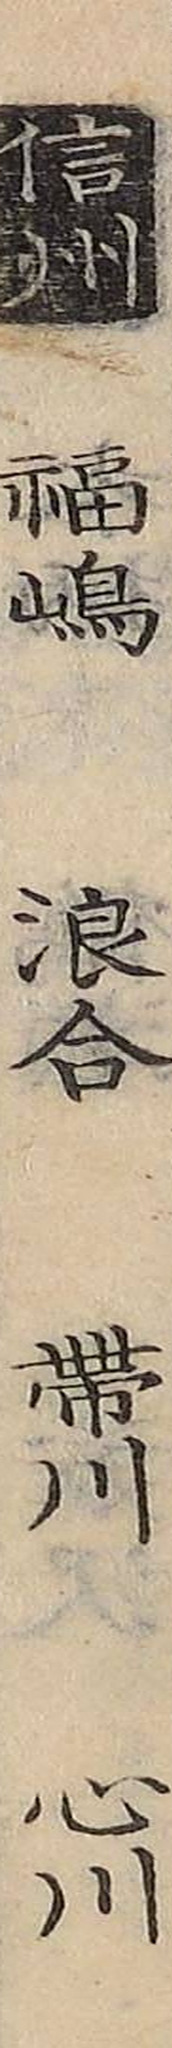信州福島浪合帯川心川
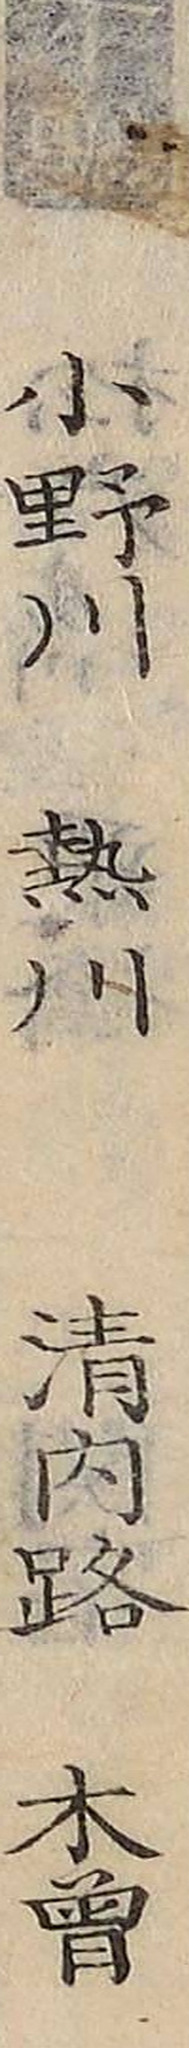小野川熱川清内路木曽
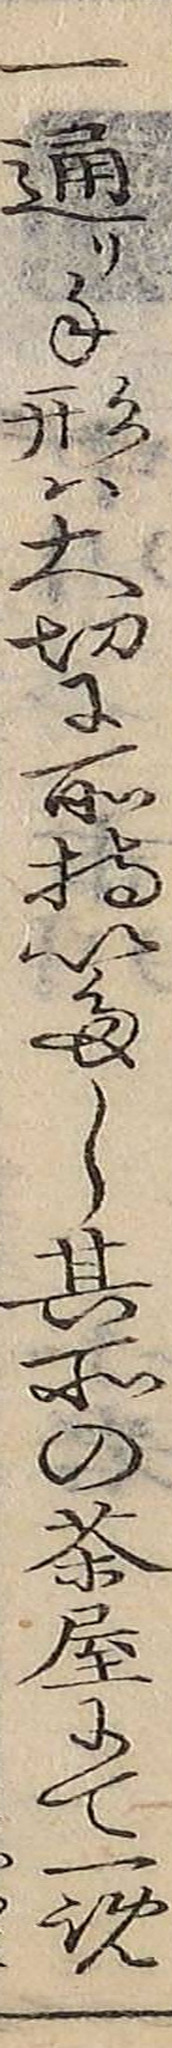一通手形は大切に所持いたし其所の茶屋にて一度
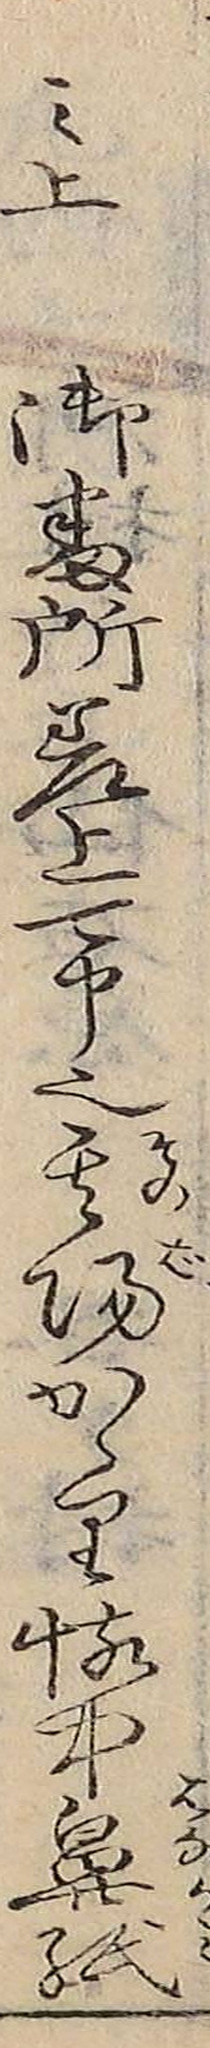み上御番所差上て申也其場かゝり懐中鼻紙
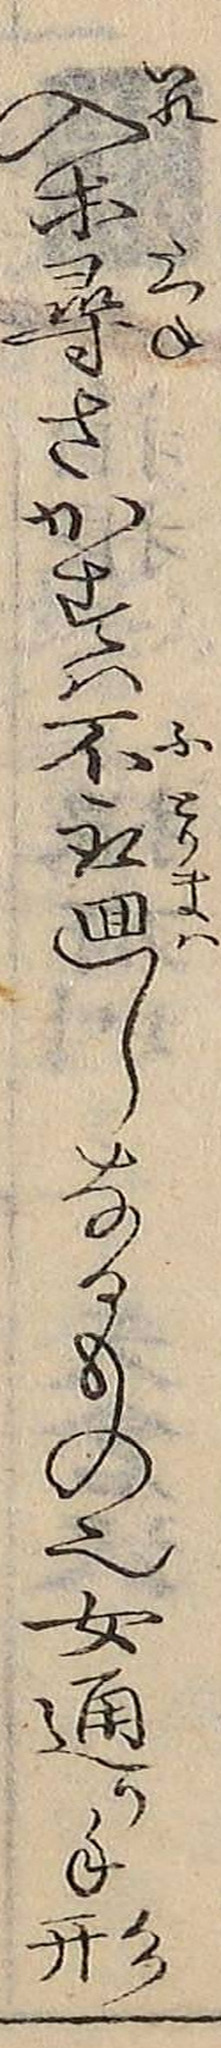入等尋さかすは不取廻しなるもの也女通手形
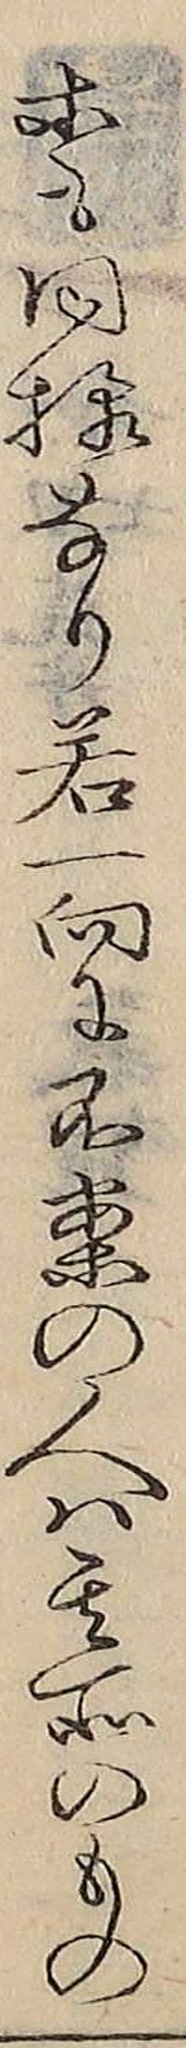等も同様なり若一向に不案の人は其所のもの
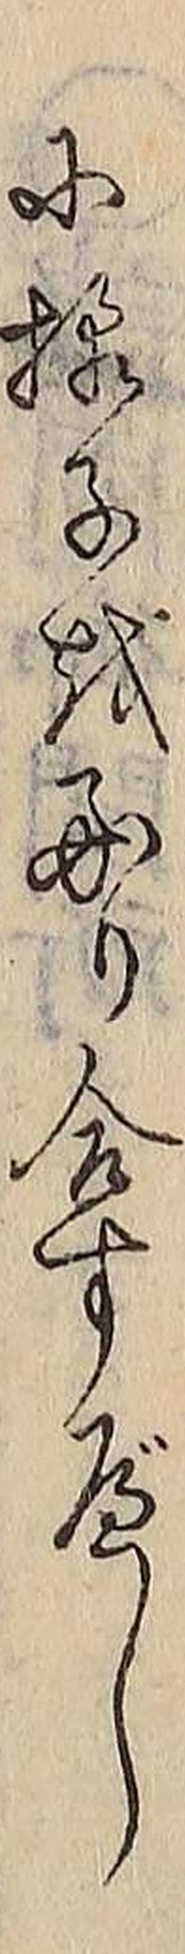に様子を承り合すべし
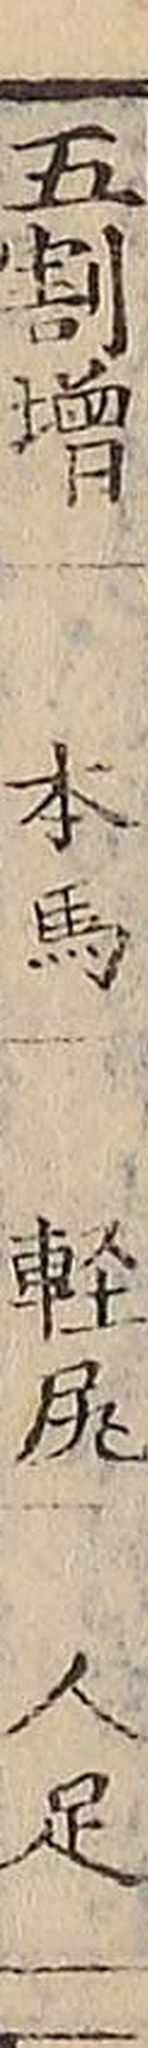五割増本馬軽尻人足
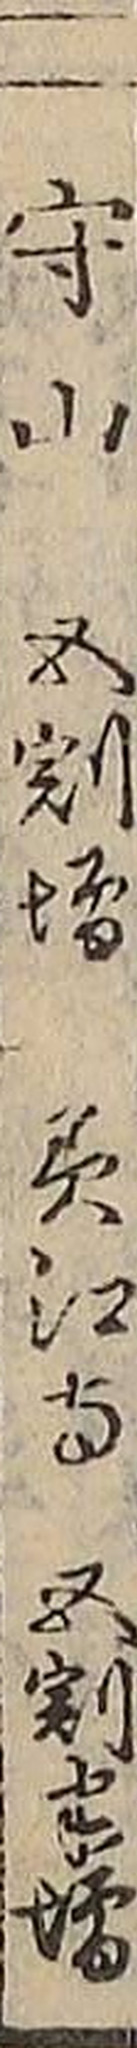守山五割増美江寺五割半増
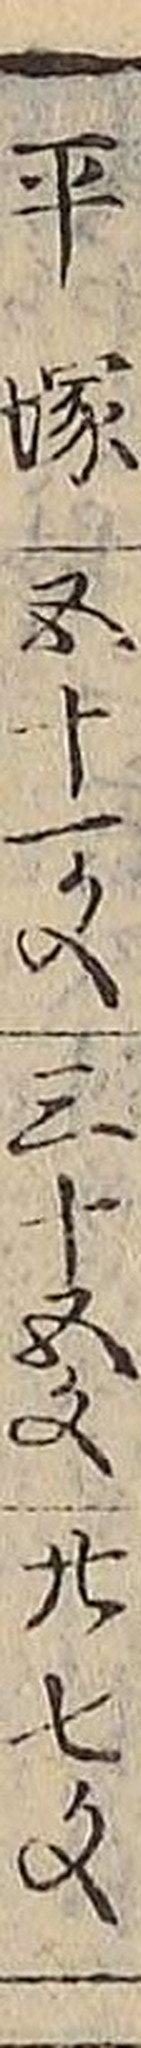平塚五十一文三十五文廿七文
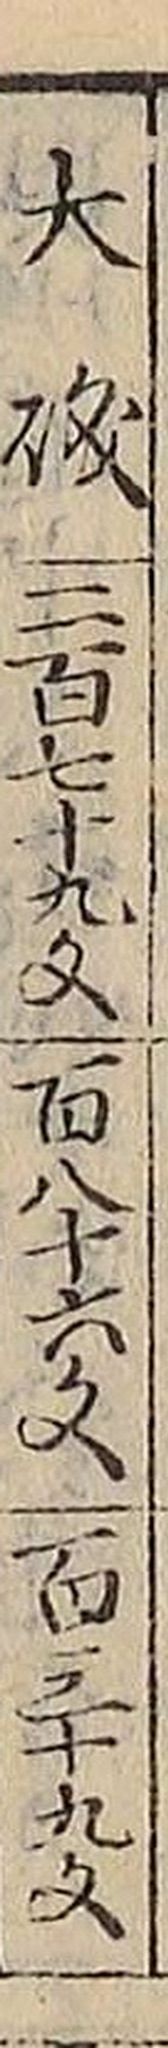大磯二百七十九文百八十六文百三十九文
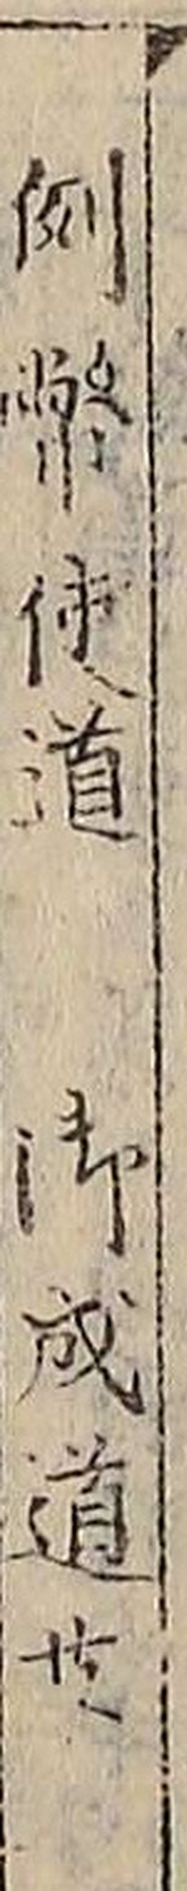例幣使道御成道共
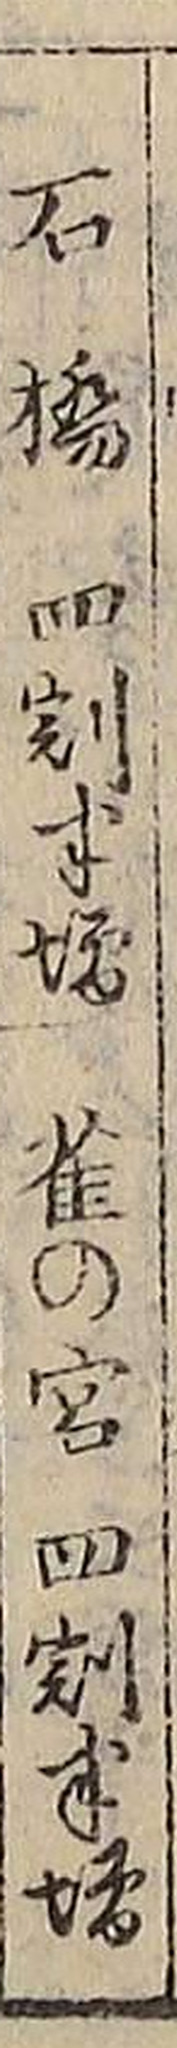石橋四割半増雀の宮四割半増
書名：旅行用心集
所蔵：神戸大学附属図書館 国文学研究資料館
